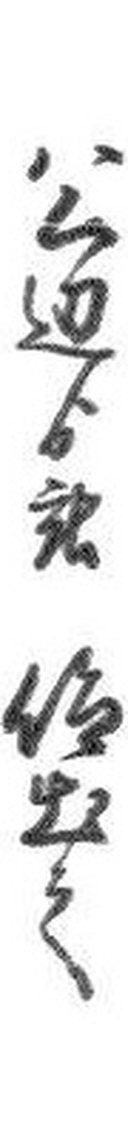公辺ゟ被仰出之
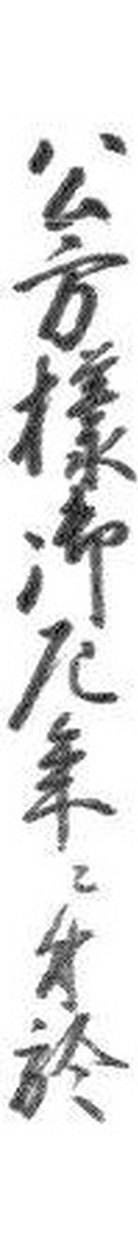公方様御厄年ニ付於
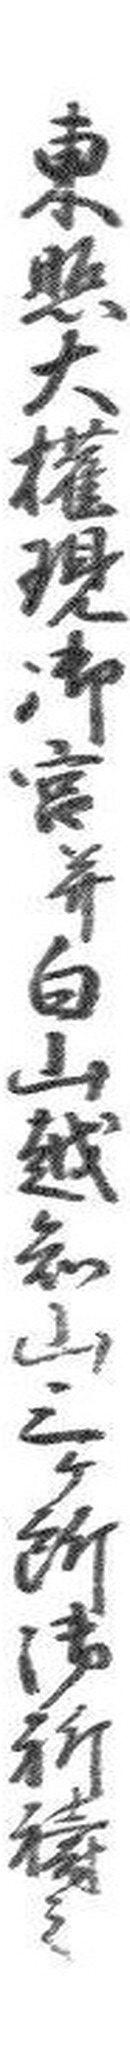東照大権現御宮并白山越知山三ヶ所御祈祷之
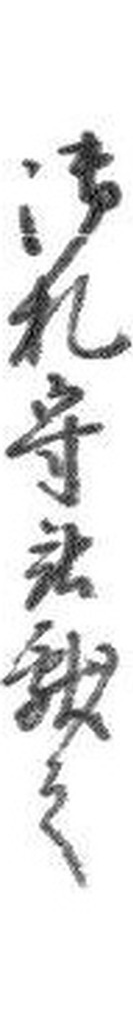御札守被献之

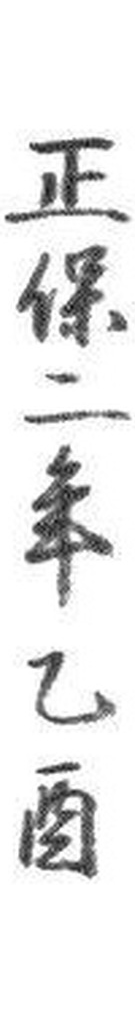正保二年乙酉
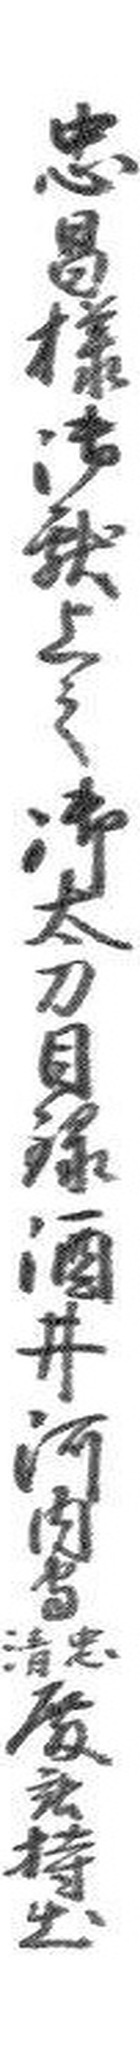忠昌様御献上之御太刀目録酒井河内守忠清殿被持出
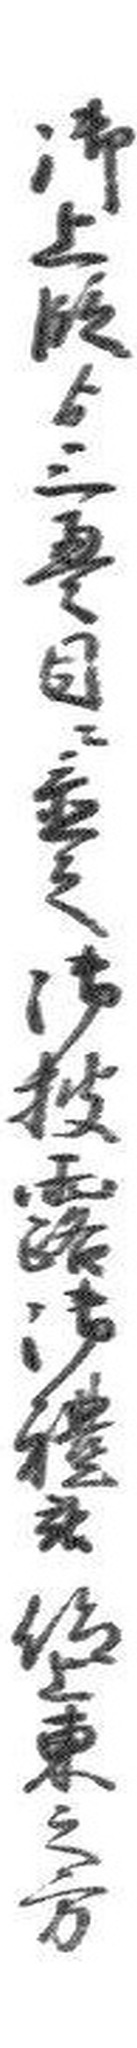御上段ゟ三畳目ニ置之御披露御礼被仰上東之方
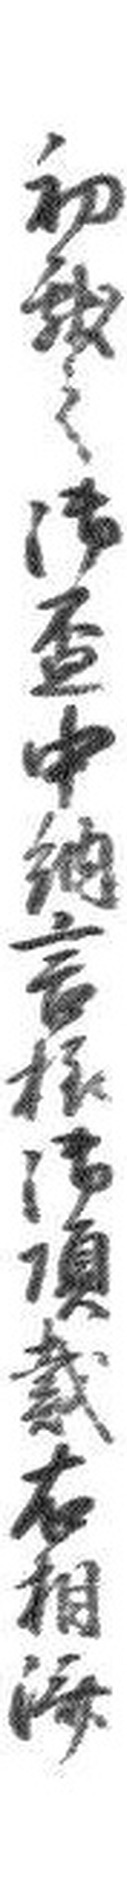初献之御盃中納言様御頂戴右相済

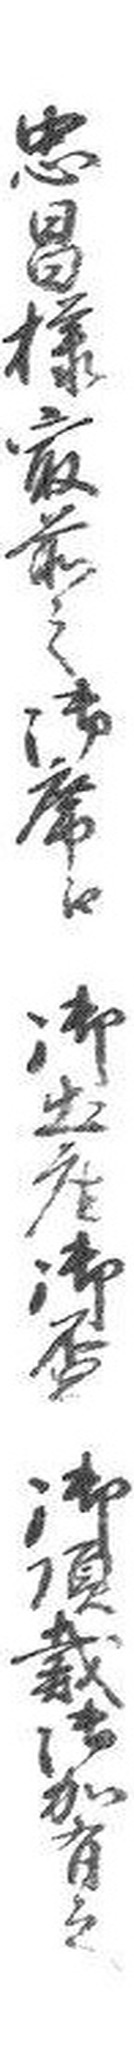忠昌様最前之御席江御出座御盃御頂戴御加有之
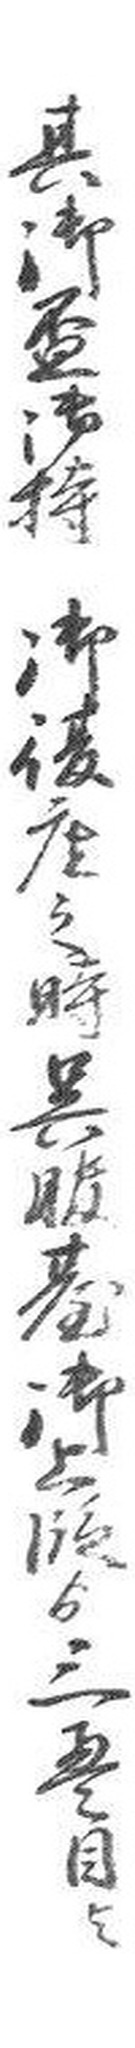其御盃御持御復座之時呉服台御上段ゟ三畳目与
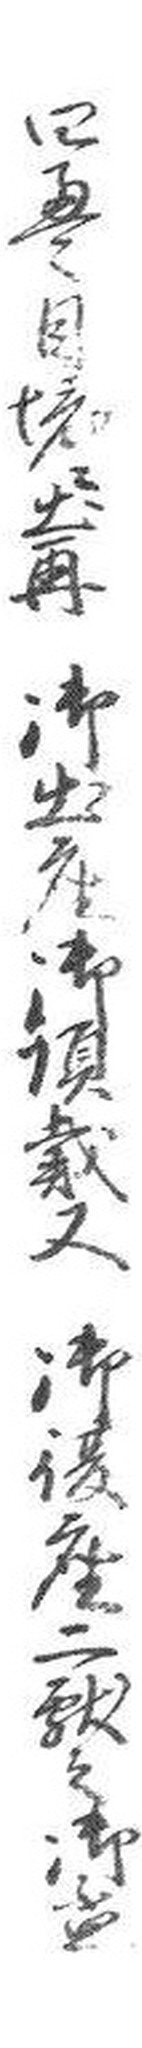四畳目境ニ出再御出座御頂戴又御復座二献之御盃
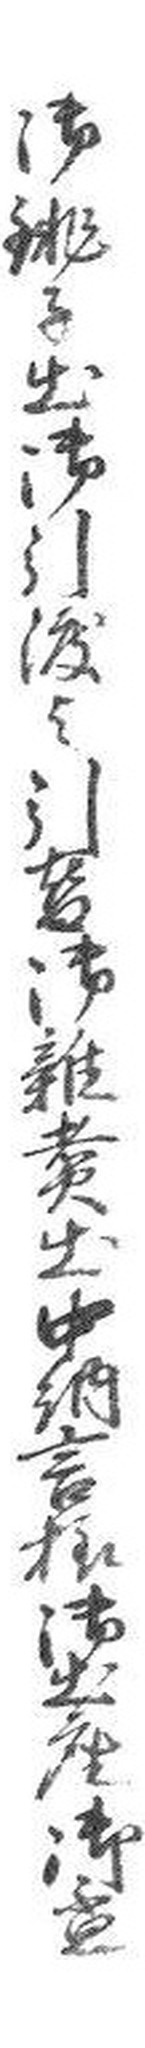御銚子出御引渡与引替御雑煮出中納言様御出座御盃
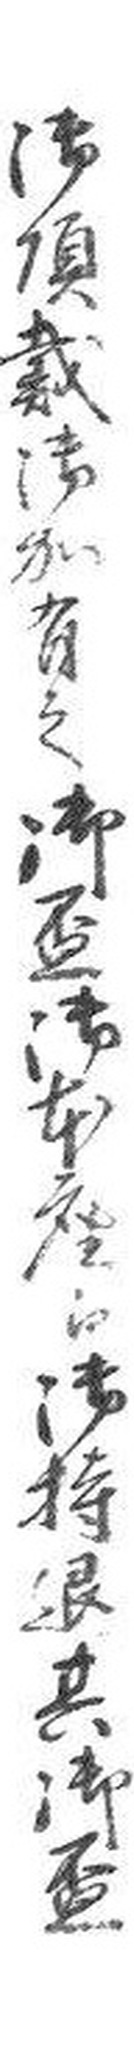御頂戴御加有之御盃御本座江御持退其御盃
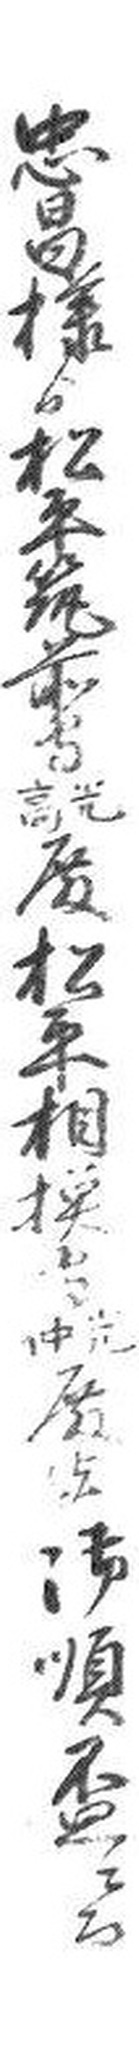忠昌様ゟ松平筑前守光高殿松平相模守光仲殿迄御順盃ニ而
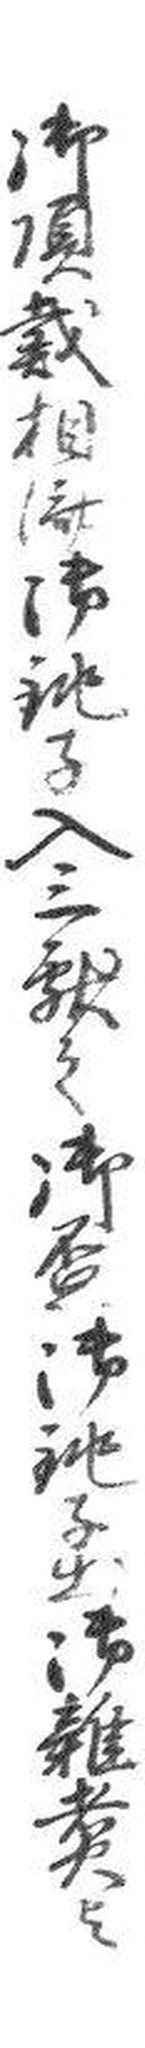御頂戴相済御銚子入三献之御盃御銚子出御雑煮与
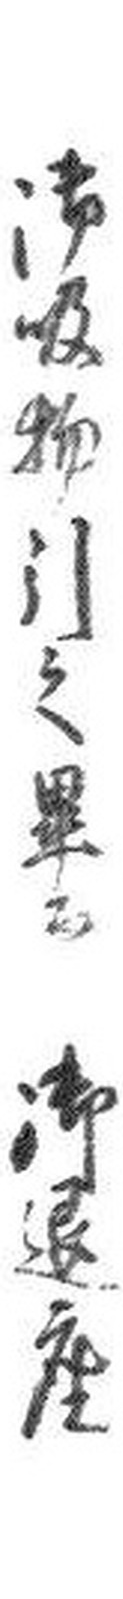御吸物引之畢而御退座
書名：家譜 四 忠昌公 従寛永七年到正保四年
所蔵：福井県文書館 Fukui Prefectural Archives
